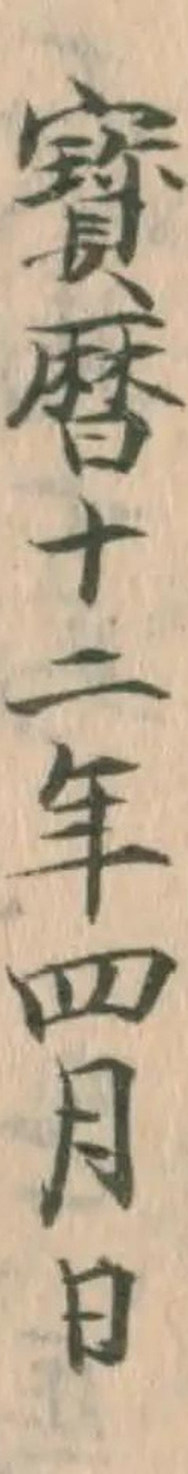寶暦十二年四月日
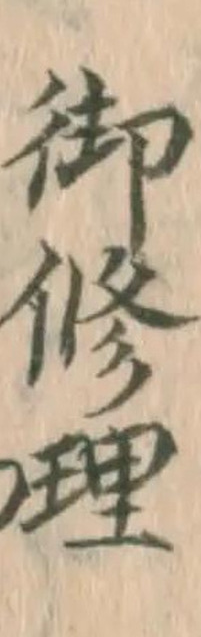御修理
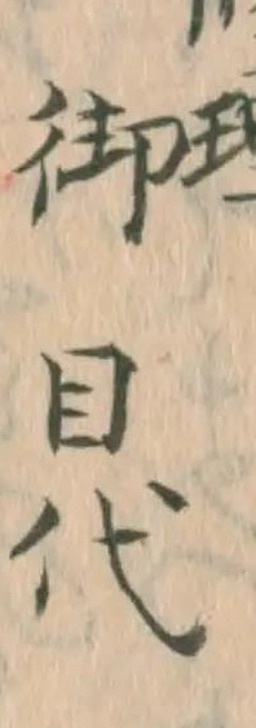御目代
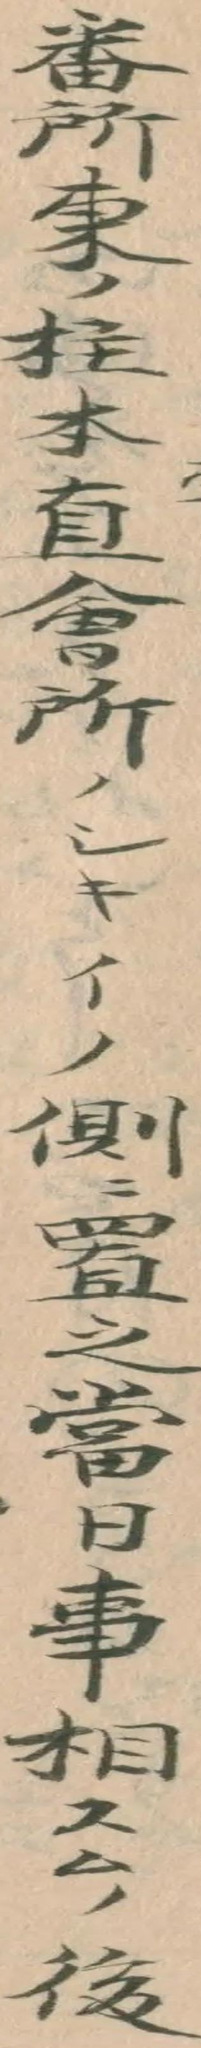番所東ノ柱本直會所ノシキイノ側ニ置之當日事相スムノ後
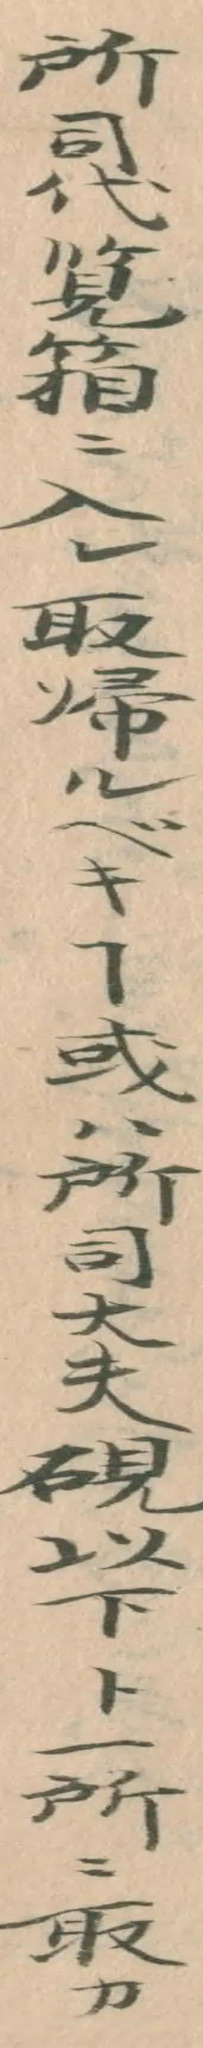所司代覧箱ニ入レ取帰ルベキヿ或ハ所司大夫硯以下ト一所ニ取カ
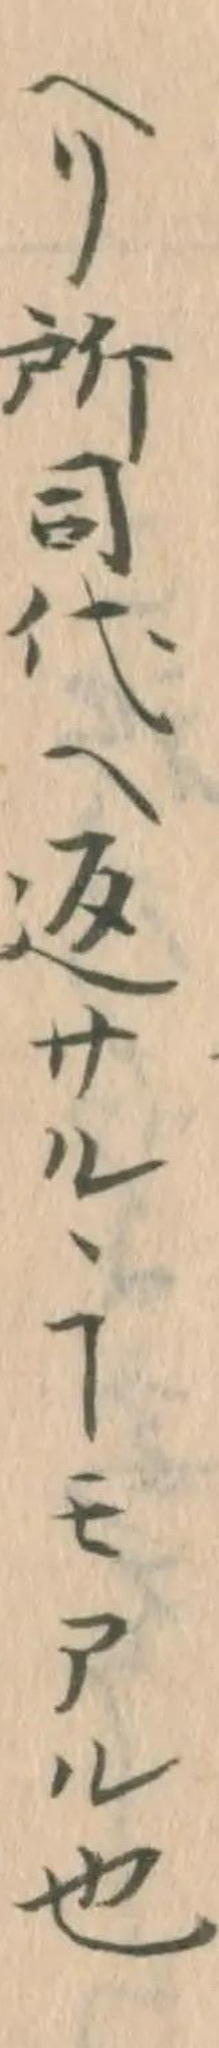ヘリ所司代へ返サルヽヿモアル也

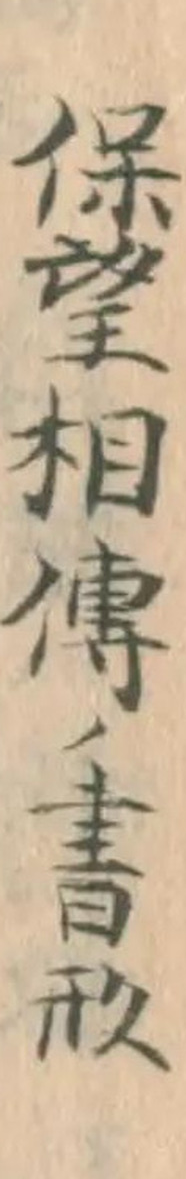保望相傳書形
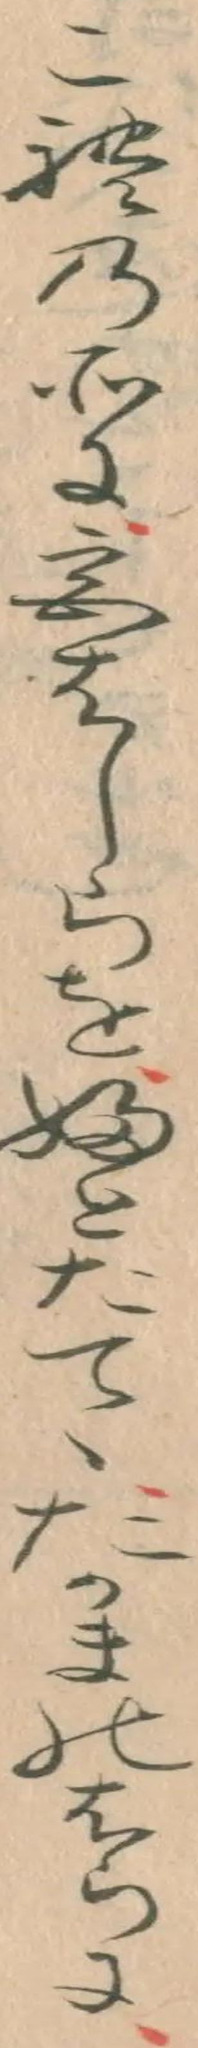これの所に宮はしらをふとたてゝたかまのはらに
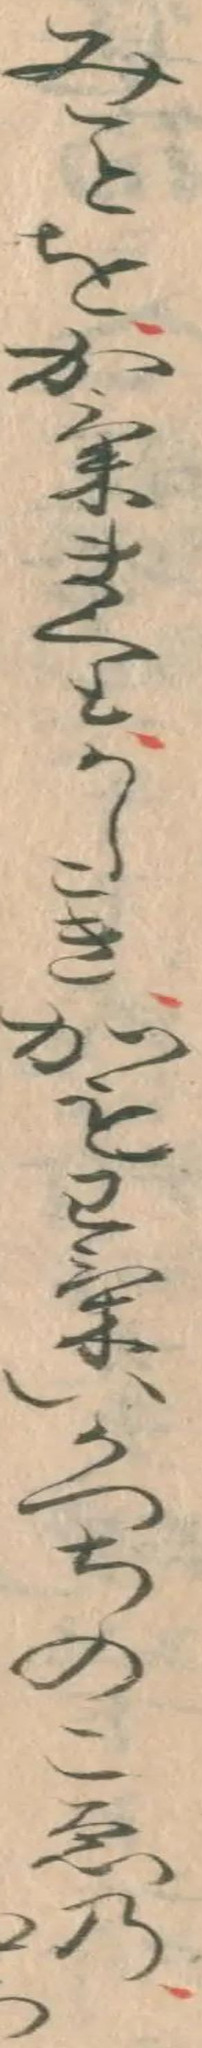みことをかけまくもかしこきかもわけいかつちのこゑのひろ
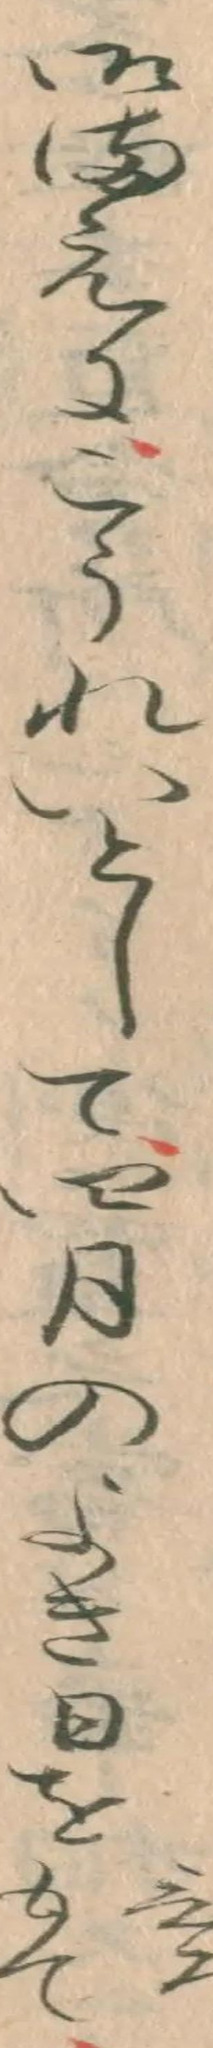御まえにこうれいとして四月のよき日をもて
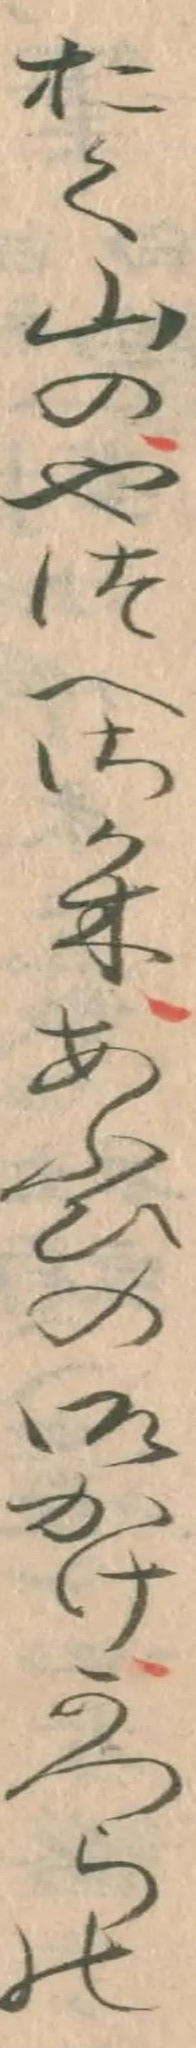おく山のやつへさか木あふひの御かけかつらの
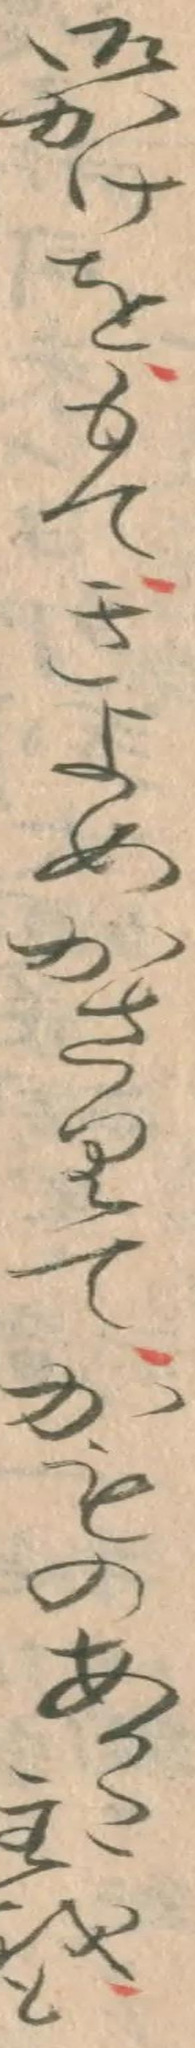御かけをもてきよめかさりてかものあかた主をも
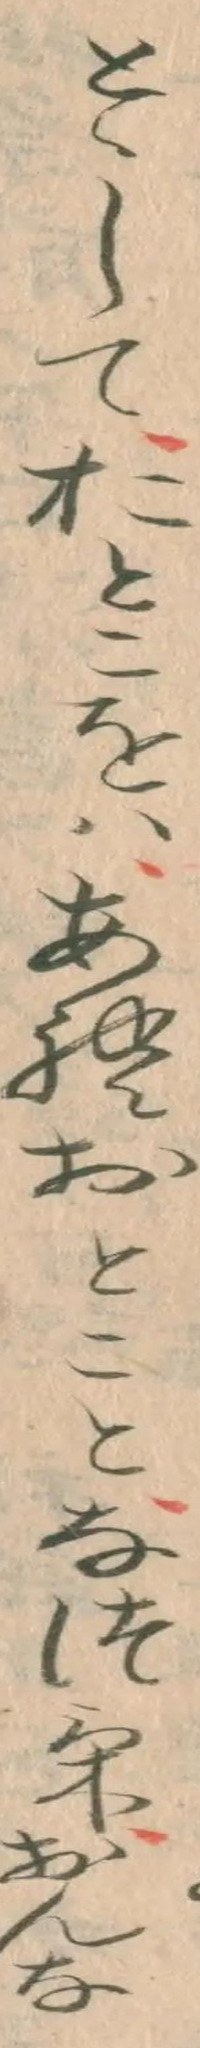とゝしておとこをハあれおとことなつけおんな
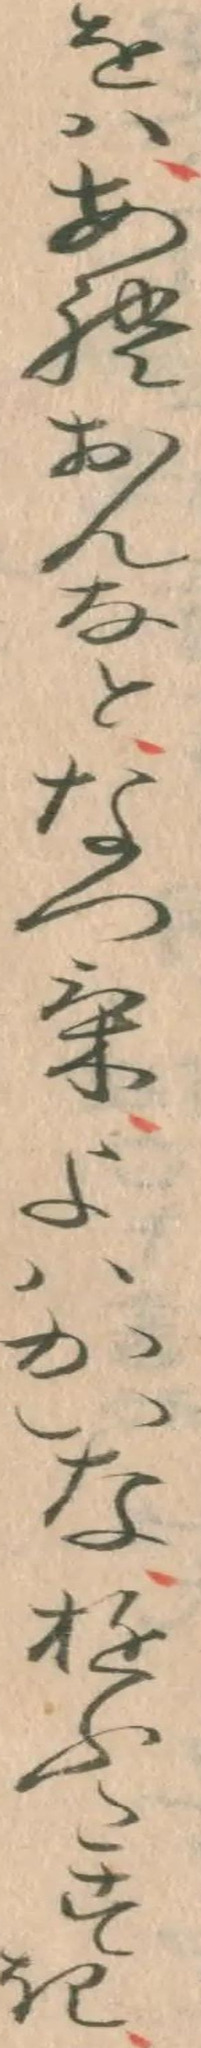をハあれおんなとなつけよハかいなゆふたすき
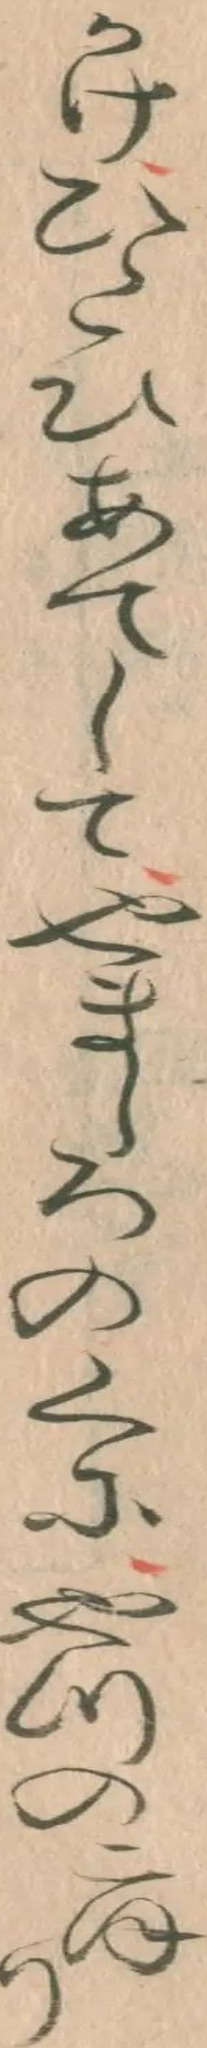かけひたひあてしてやましろのくにやつのほり
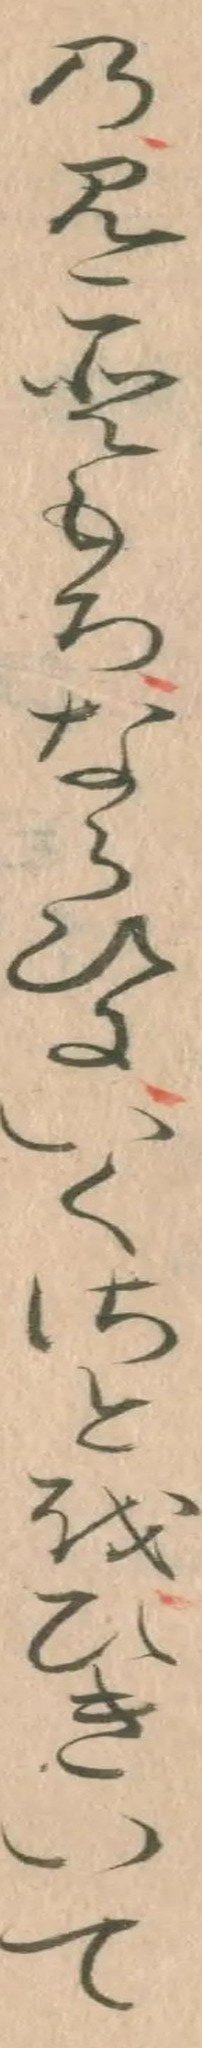のみこともちならひにいくさとをひきいて
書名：賀茂社記録. 第40冊
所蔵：国立国会図書館 National Diet Library, JAPAN
